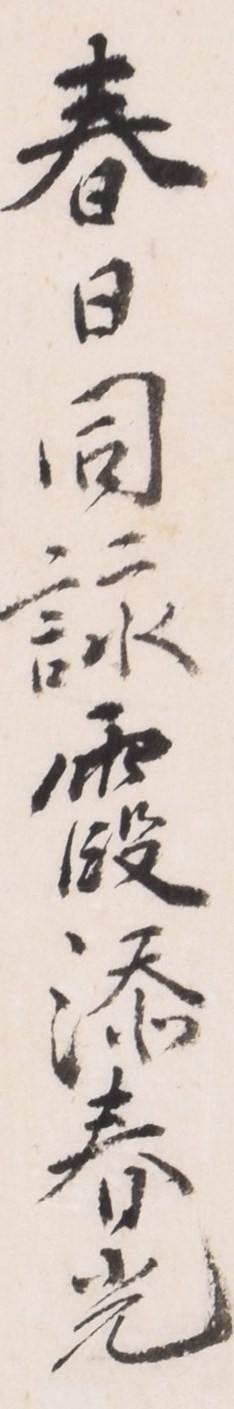春日同詠霞添春光
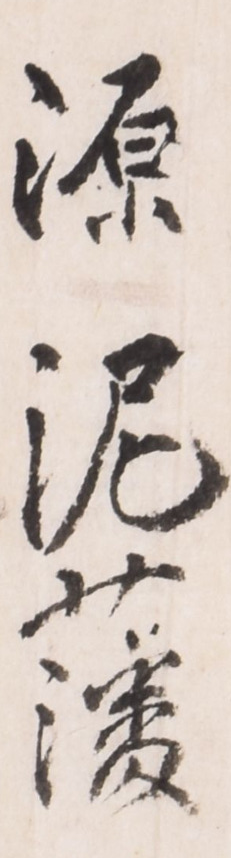源泥藩
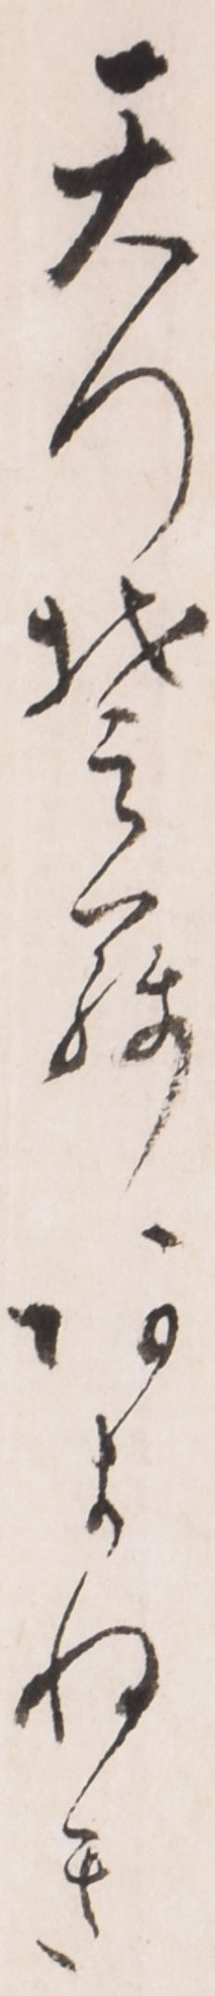天つそらあまねき
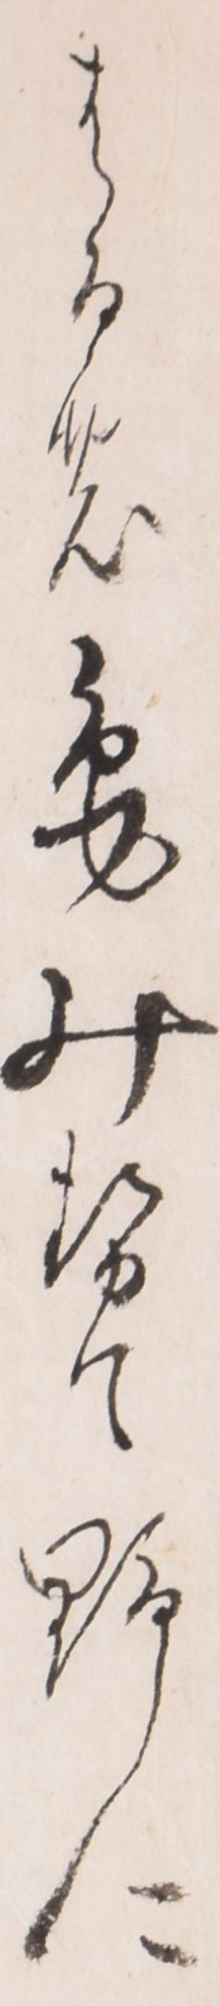はるの色みせて野に
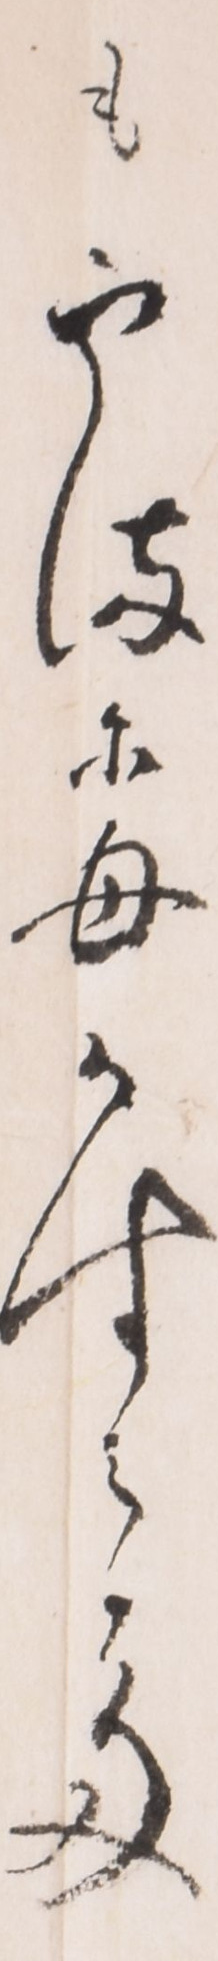もやまにもかすみた
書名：春日同詠霞添春光和歌（写カ）
